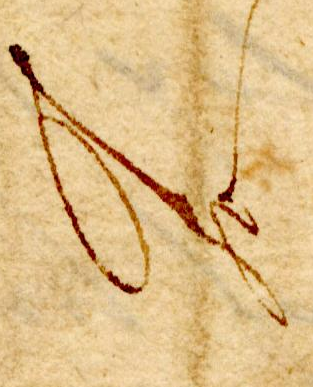To
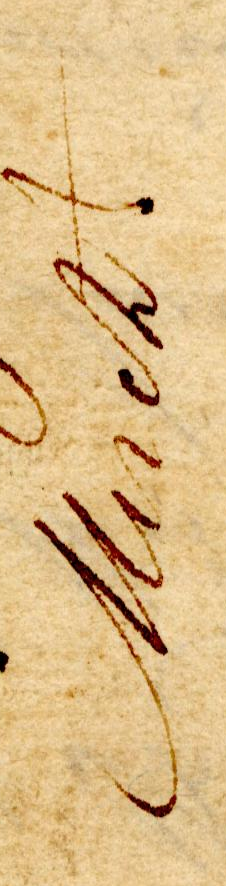Merch^t.
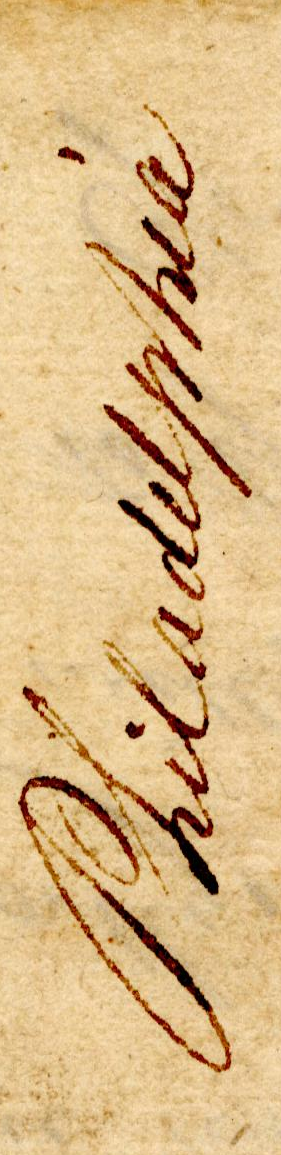Philadelphia
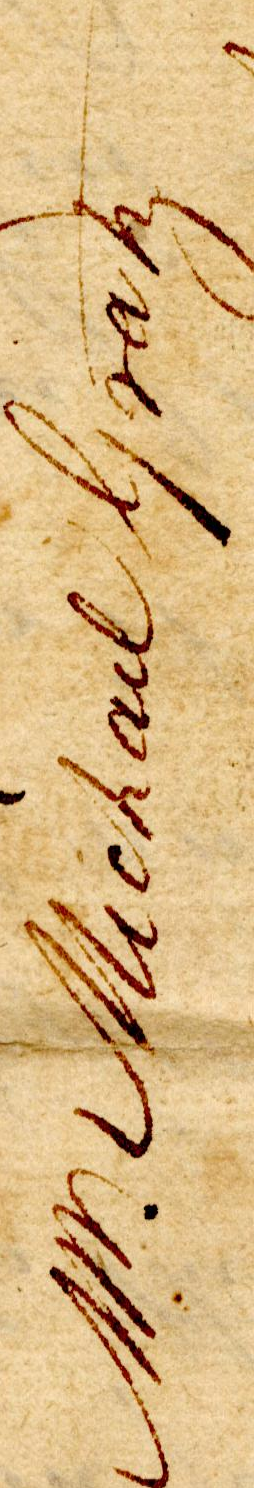M^r. Michael Gratz
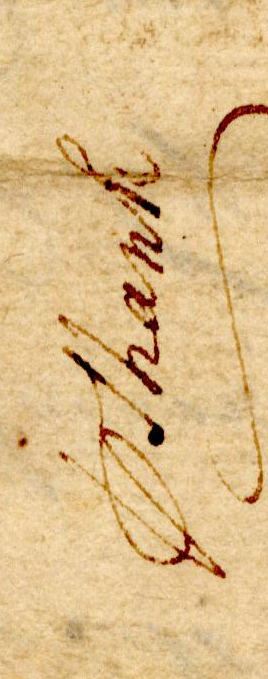per Shank
